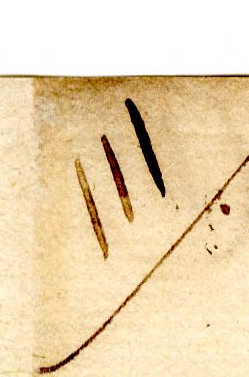111
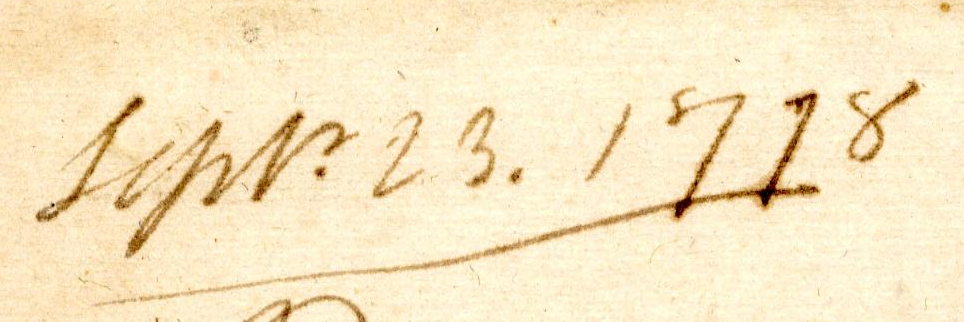Sept^r 23. 1778
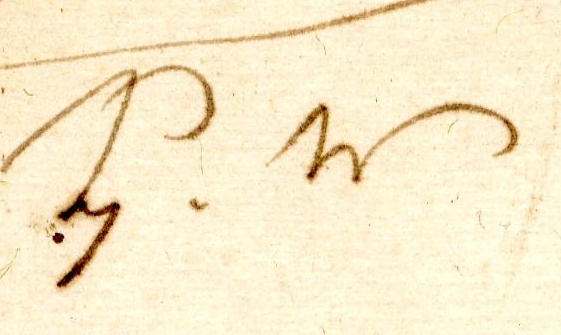G.W
